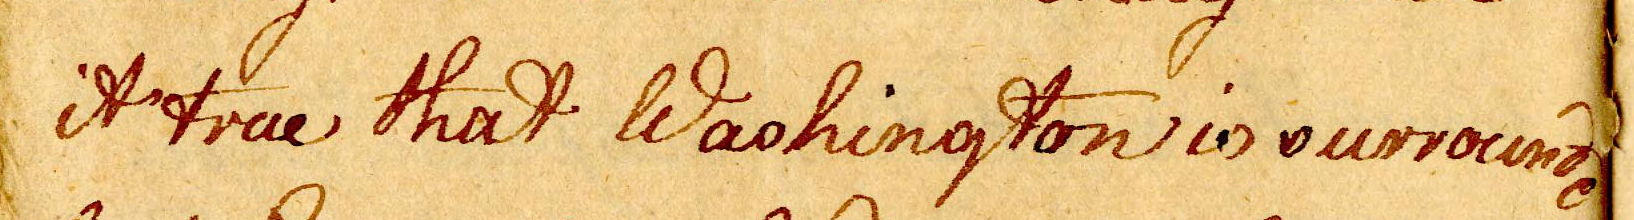it true that Washington is surrounde
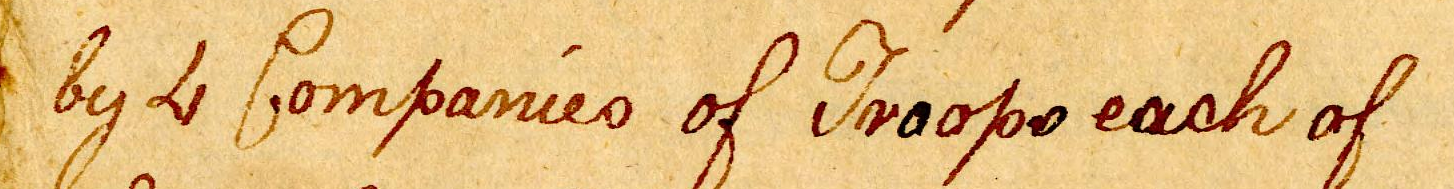by 4 Companies of Troops each of
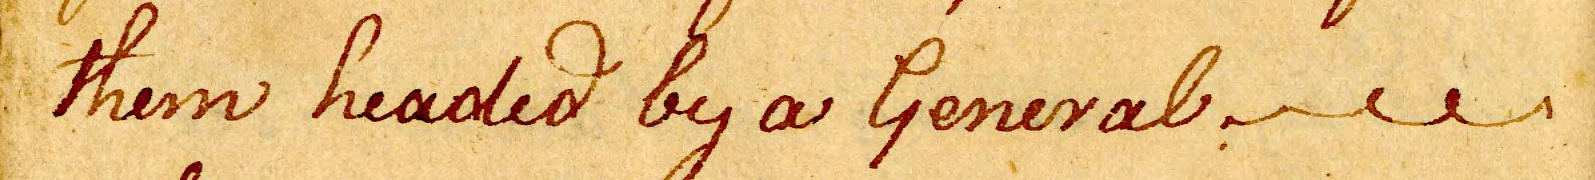them headed by a General-
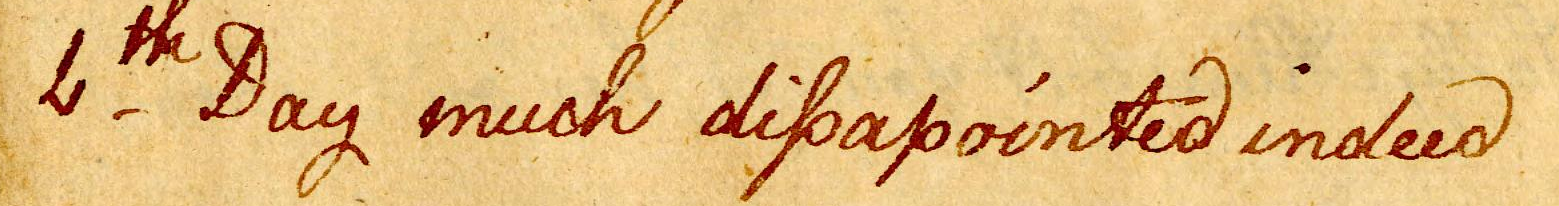4^th Day much dissapointed indeed
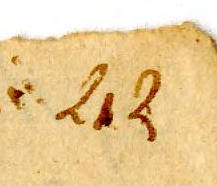42
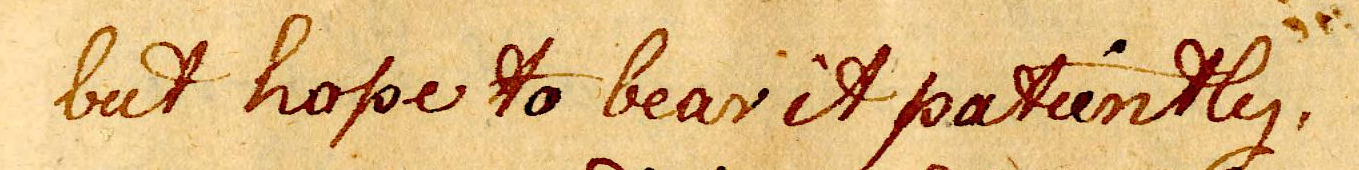but hope to bear it patiently,
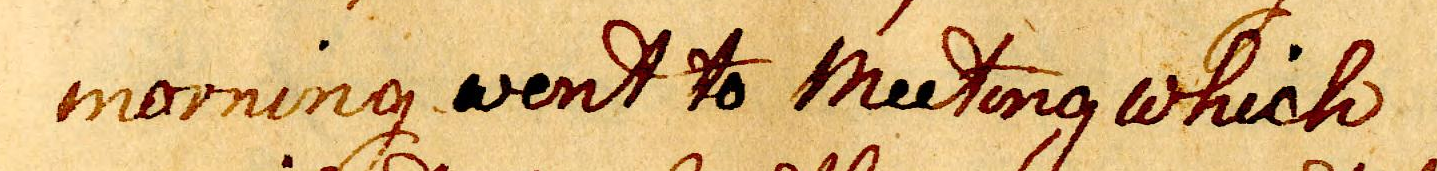morning went to Meeting which
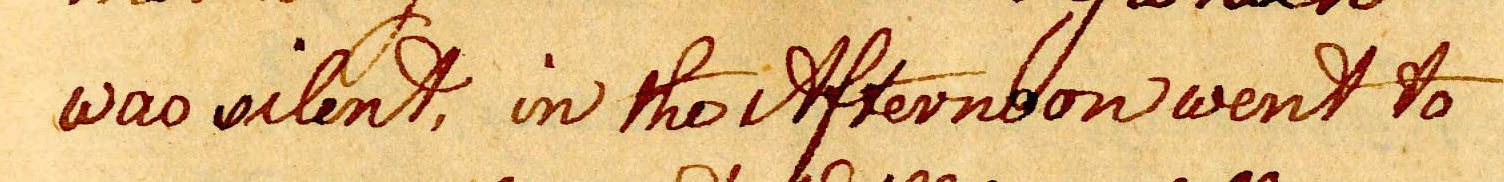was silent, in the Afternoon went to
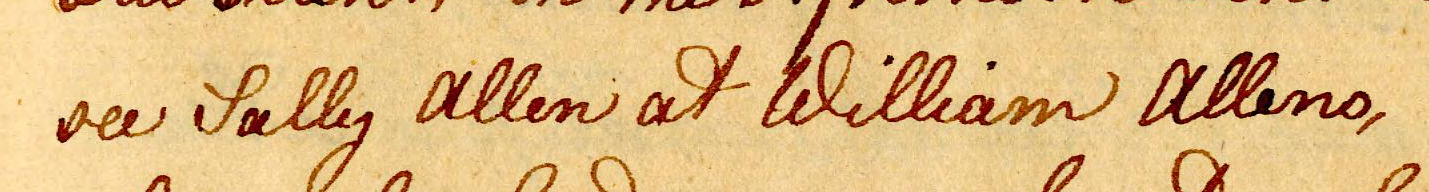see Sally Allen at William Allens,
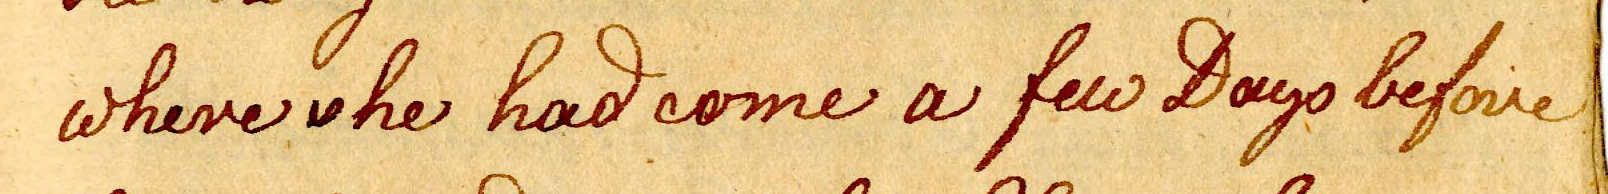where she had come a few Days before
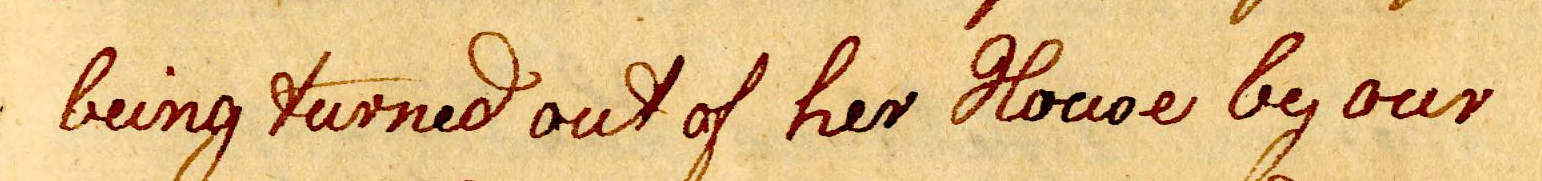being turned out of her House by our
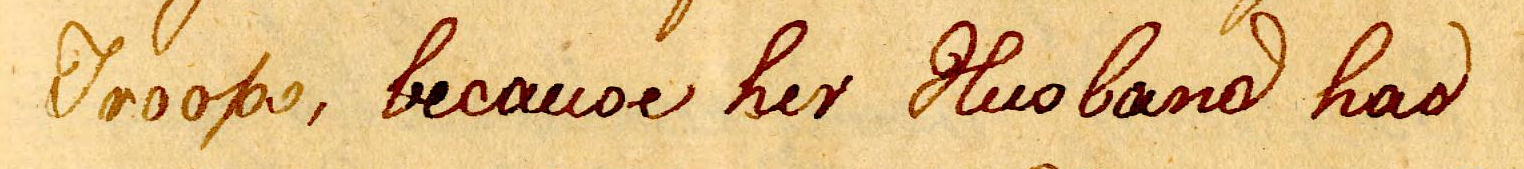Troops, because her Husband had
